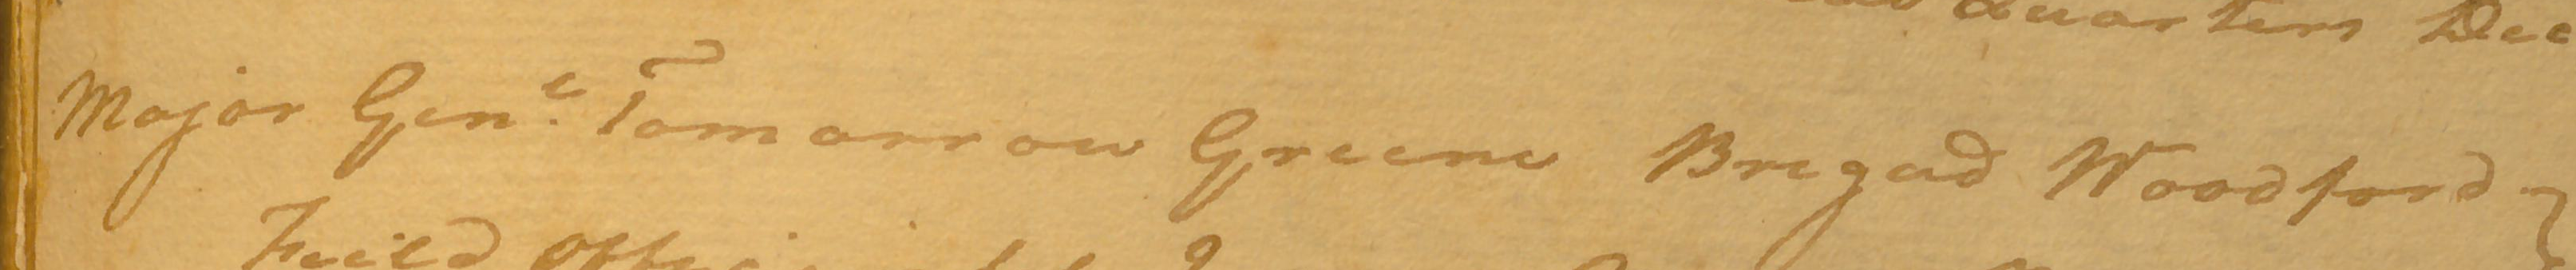Major Gen^l. Tomorrow Greene Brigad Woodford
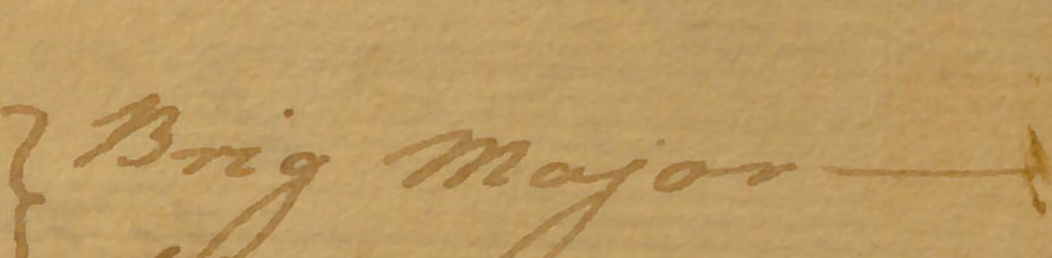Brig Major-
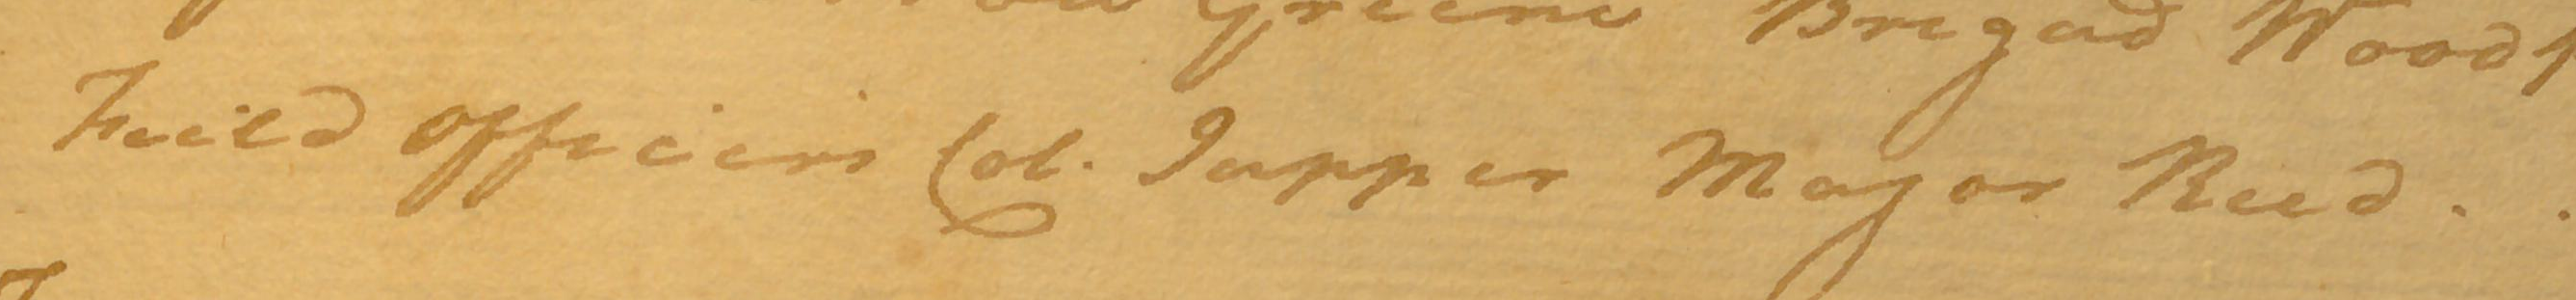Field Officers Col. Japper Major Reed.
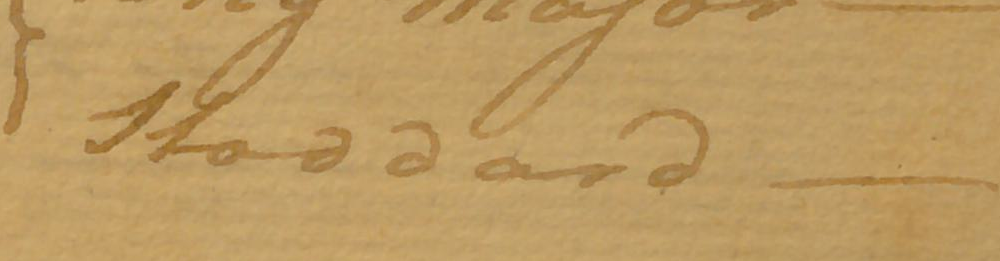Hoddard-
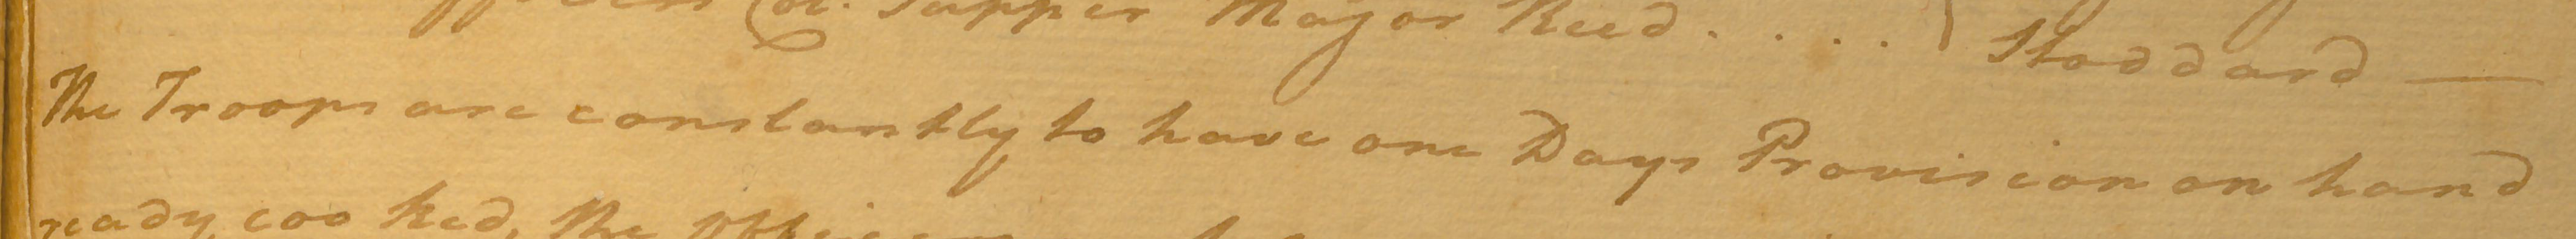The Troops are constantly to have one Days Provisions on hand
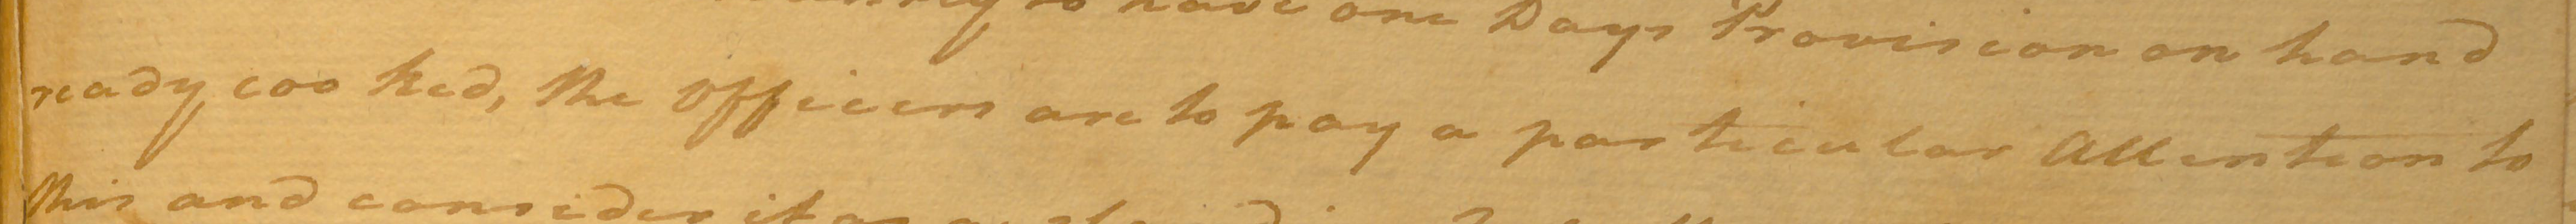ready cooked, the Officers are to pay a particular Attention to
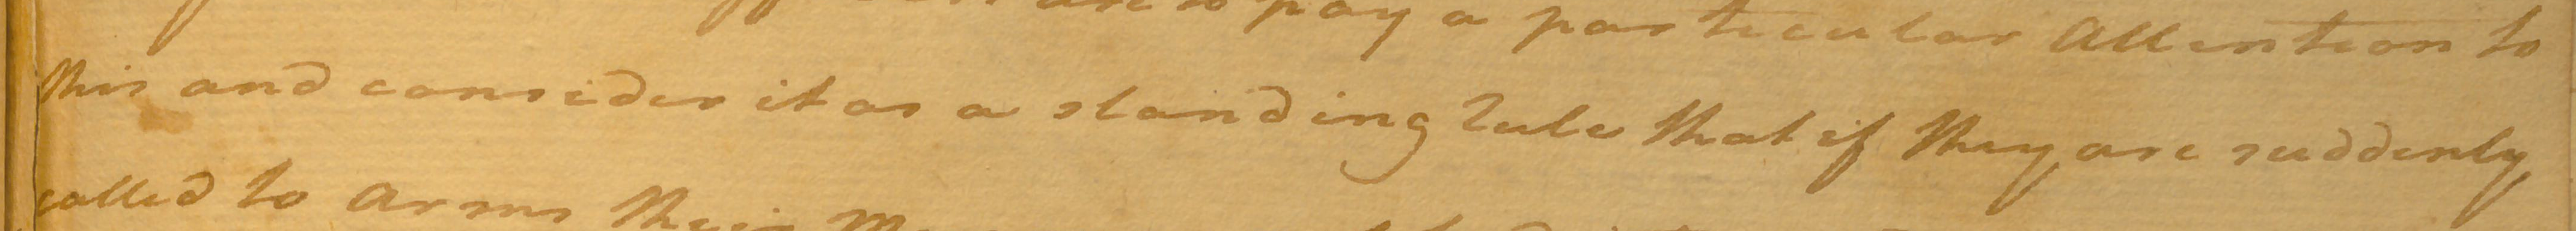theirs and consider it as a standing rule that if they are suddenly
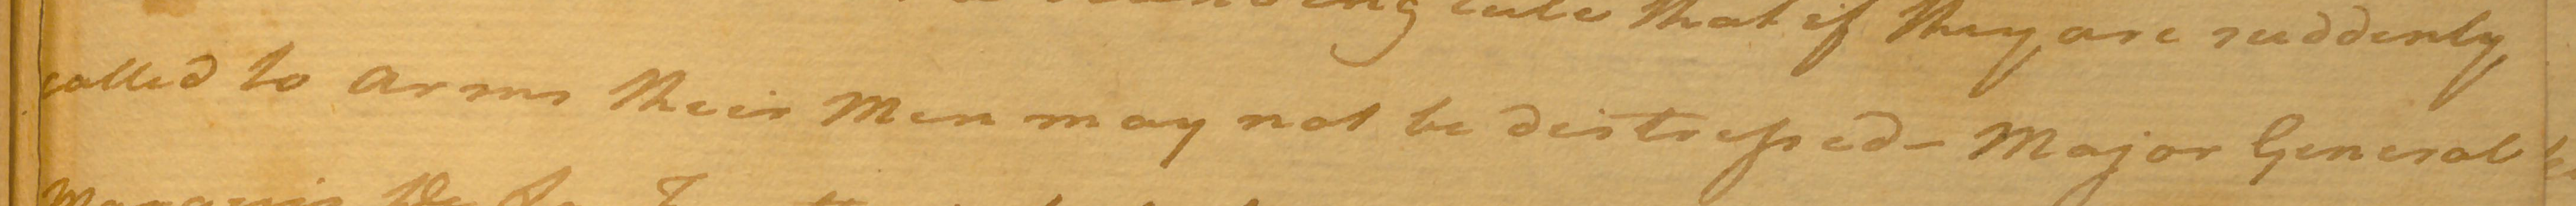called to Arms their Men may not be distressed- Major General
